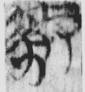豢
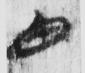甶（思）
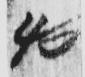左
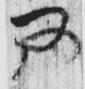尹
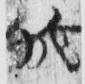{力它}
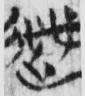○（踐）
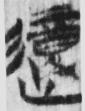○（復）
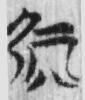凥
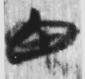甶（思）
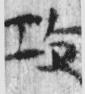攻
